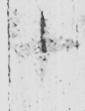七
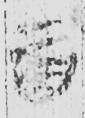百
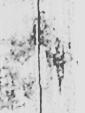千
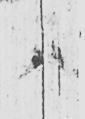八
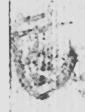百
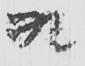九
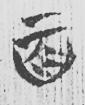百
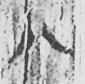八
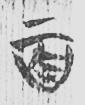百
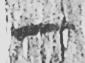一
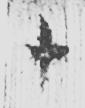十
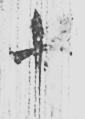七
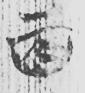百
